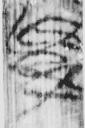○（夏）
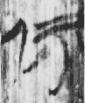𫵖
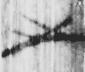之
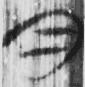月
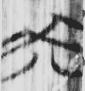癸
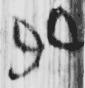卯
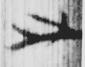之
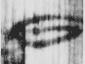日
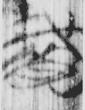戠
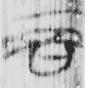言
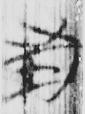市
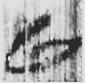㠯（以）
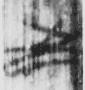至
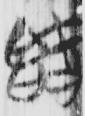既
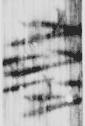涉
